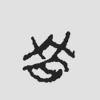冬
